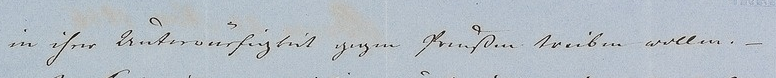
in ihrer Unterwürfigkeit gegen Preußen treiben wollen. –
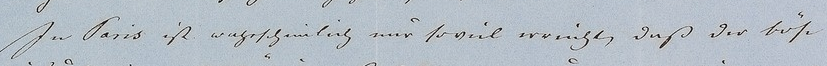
In Paris ist wahrscheinlich nur so viel erreicht, daß der böse
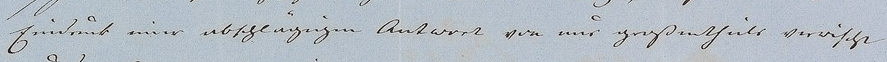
Eindruck einer abschlägigen Antwort von uns großentheils verwischt
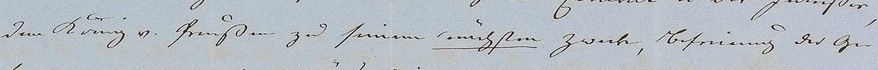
dem König v. Preußen zu seinem nächsten Zweck, Befreiung der Ge-
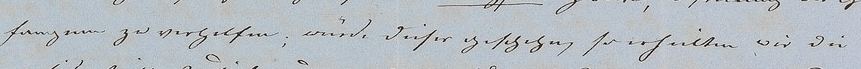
fangnen zu verhelfen; würde dieses geschehn, so erhielten wir die
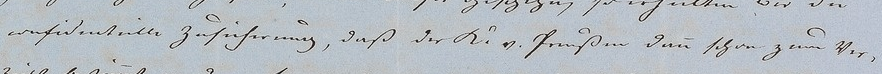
confidentielle Zusicherung, daß der K. v. Preußen dann schon zum Ver-
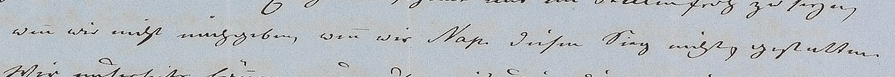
wenn wir nicht nachgeben, wenn wir Nap. diesen Sieg nicht gestatten.
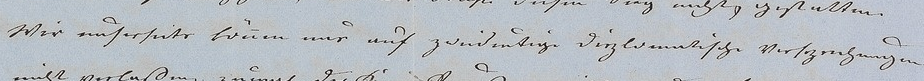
Wir unserseits können uns auf zweideutige diplomatische Versprechungen
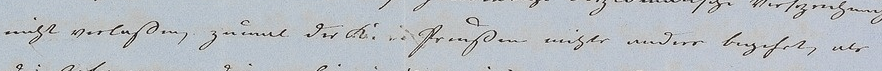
nicht verlassen, zumal der K. v. Preußen nichts anders begehrt, als
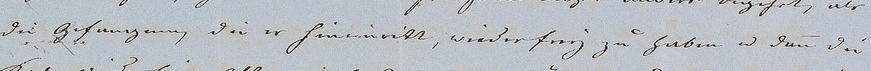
die Gefangnen, die er hineinritt, wieder frey zu haben u dann die
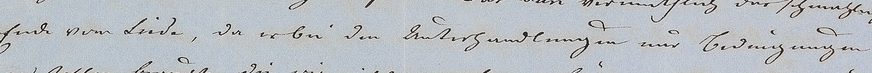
Ende vom Liede, da er bei den Unterhandlungen nur Bedingungen
